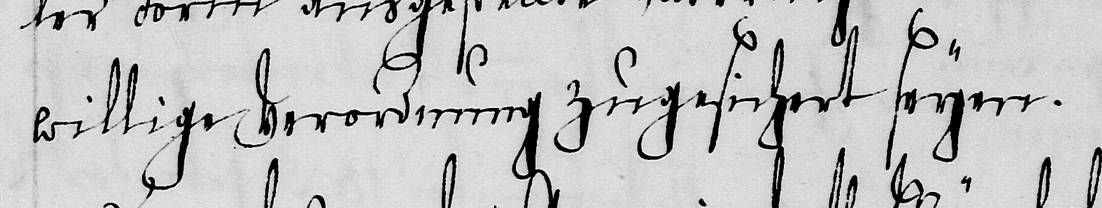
willige Verordnung zugesichert seyen.
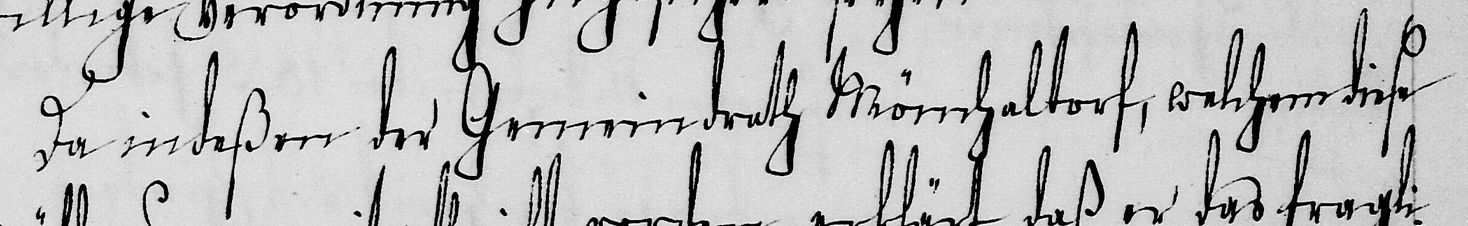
Da indeßen der Gemeindrath Mönchaltorf, welchem diese
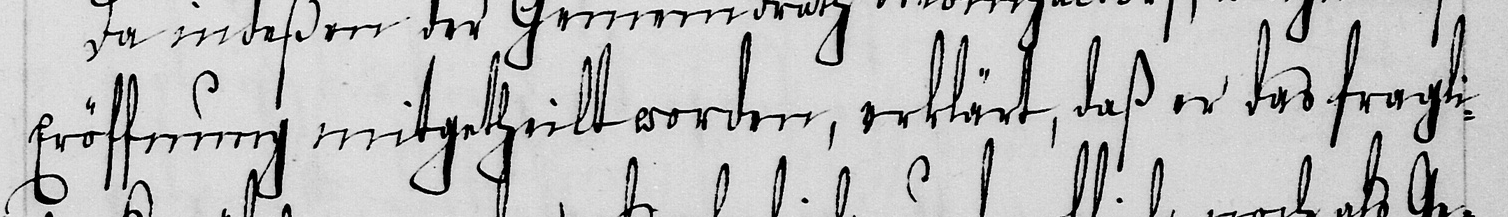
Eröffnung mitgetheilt worden, erklärt, daß er das fragli¬
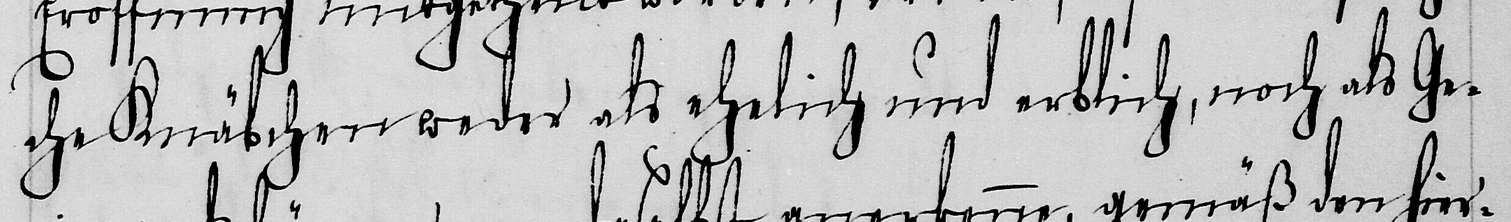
che Knäbchen weder als ehelich und erblich, noch als Ge¬
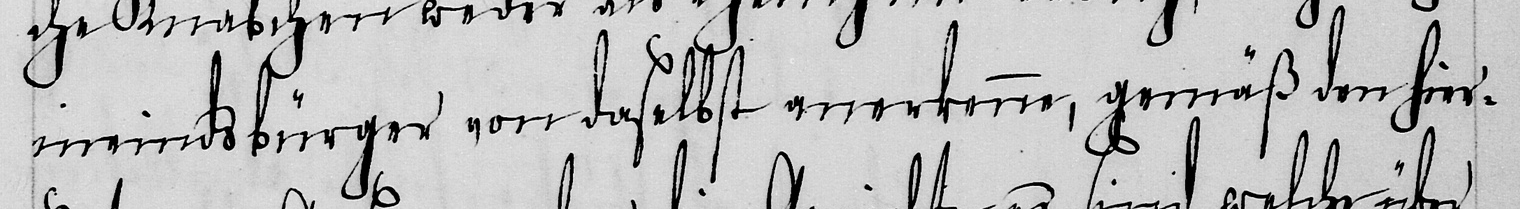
meindsbürger von daselbst anerkenne, gemäß den hier¬
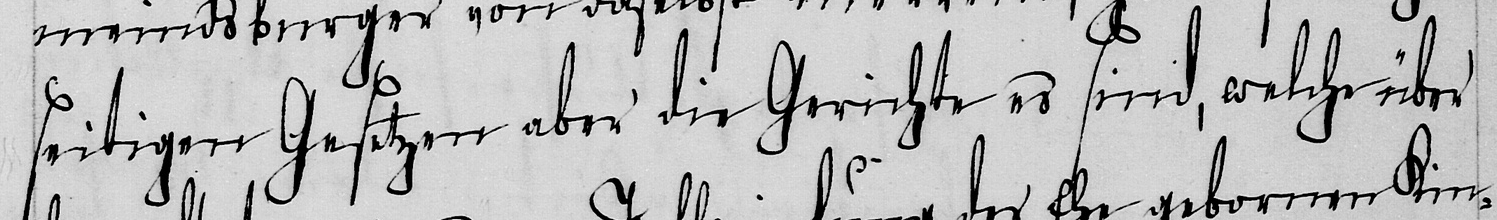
seitigen Gesetzen aber die Gerichte es sind, welche über
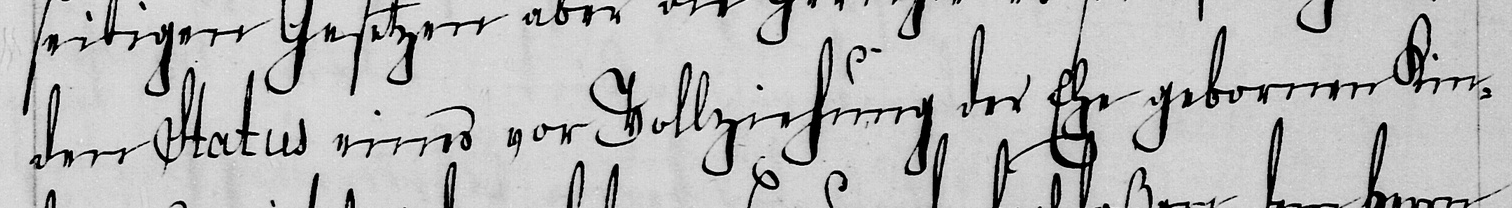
den Status eines vor Vollziehung der Ehe geborenen Kin¬
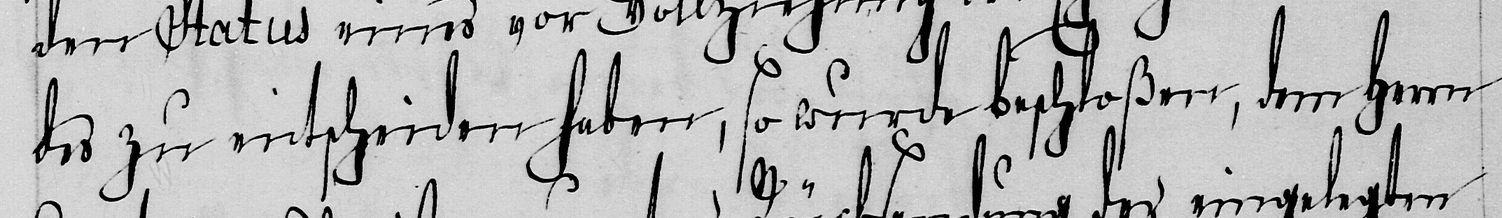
des zu entscheiden haben, so wurde beschloßen, dem Herrn
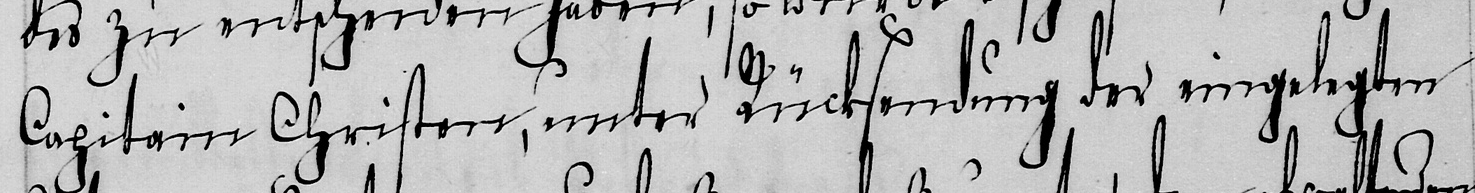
Capitain Christen, unter Rücksendung der eingelegten
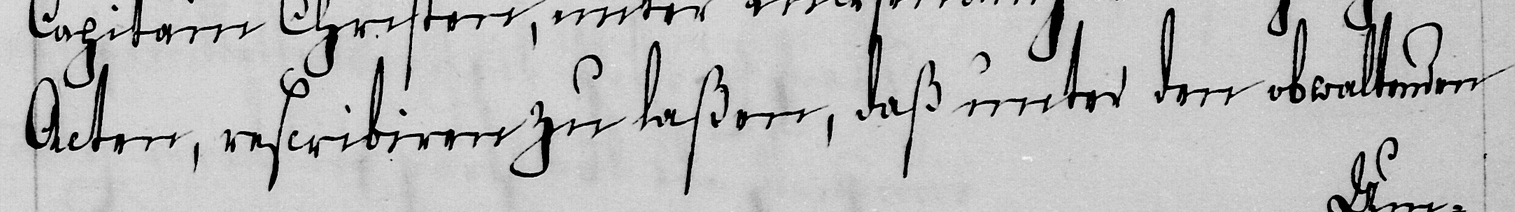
Acten, rescribiren zu laßen, daß unter den obwaltenden
